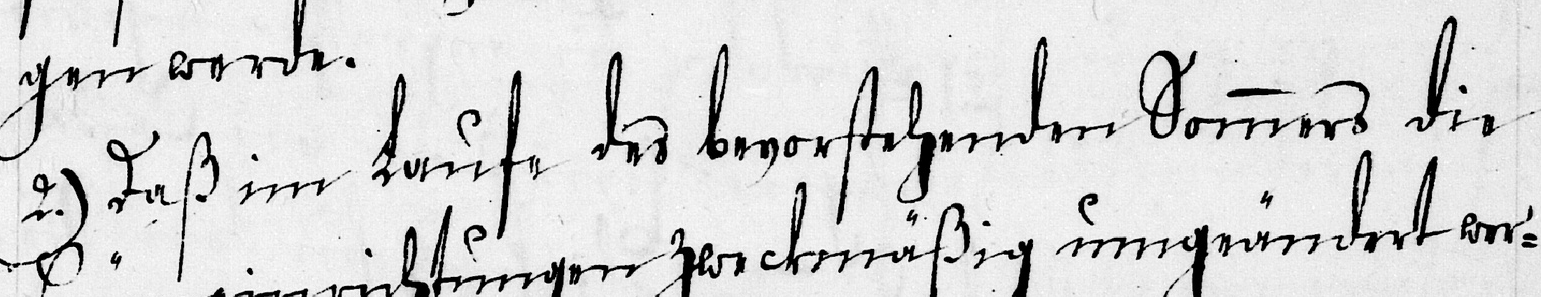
2.) Daß im Laufe des bevorstehenden Sommers die
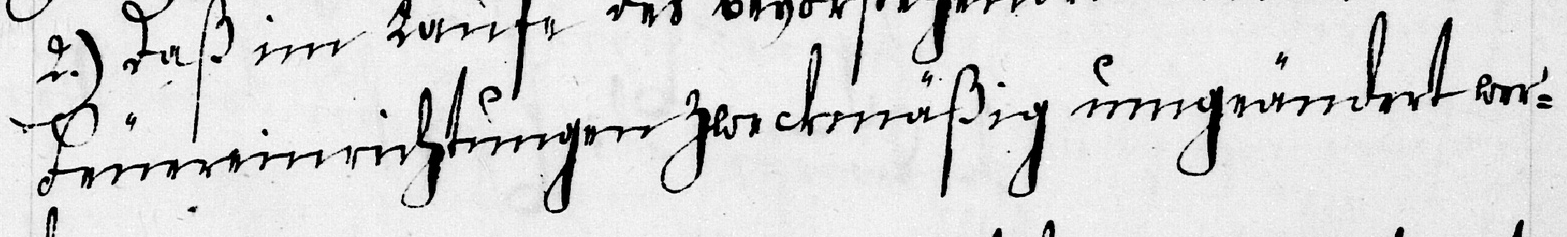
Feuereinrichtungen zweckmäßig umgeändert wer¬
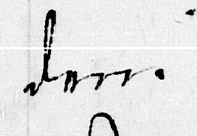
den.
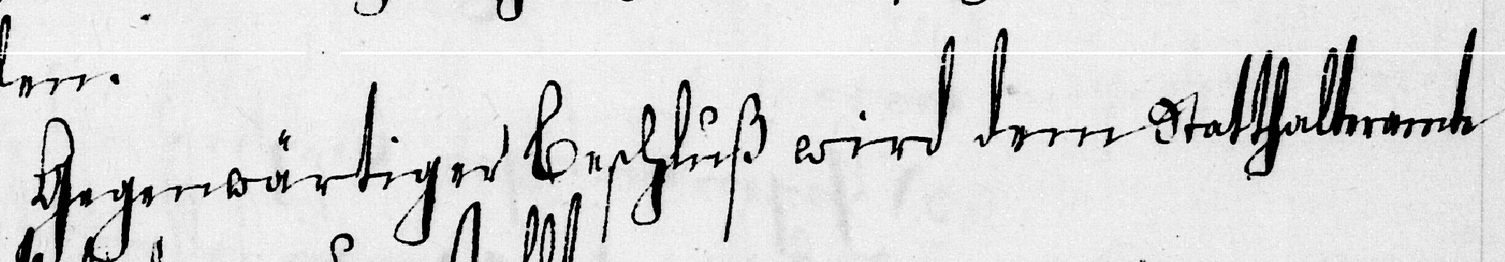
Gegenwärtiger Beschluß wird dem Statthalteramt
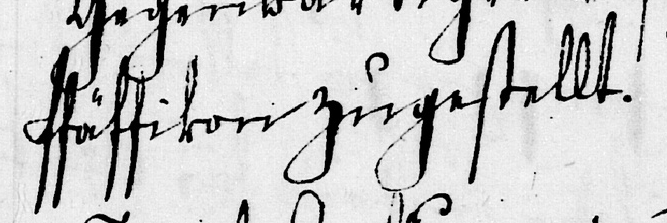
Pfäffikon zugestell¬
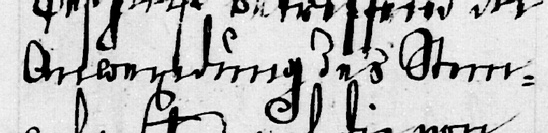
Anwendung des Stem¬
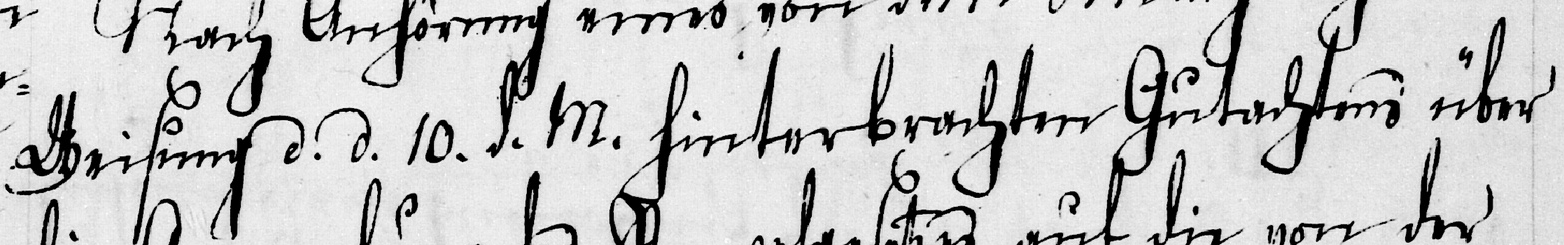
Weisung d. d. 10. d. M. hinterbrachten Gutachtens über
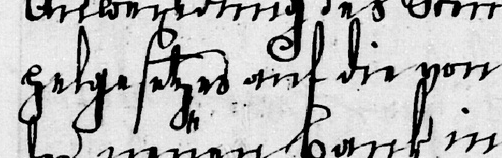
pelgesetzes auf die von
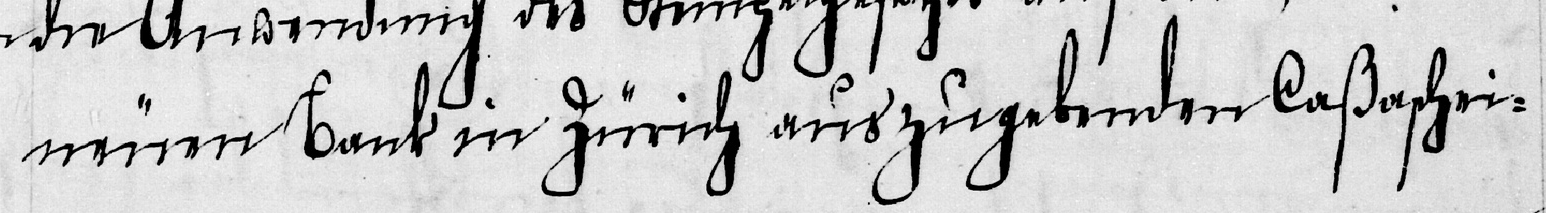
neuen Bank in Zürich auszugebenden Caßaschei-
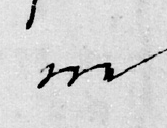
der
